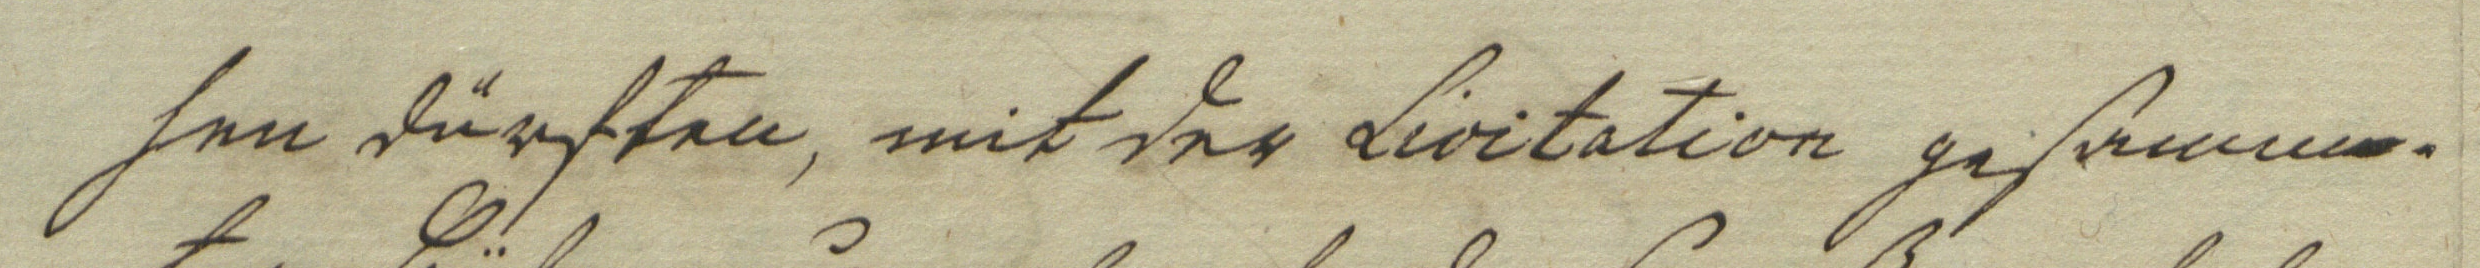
hen dürften, mit der Licitation gesamm¬
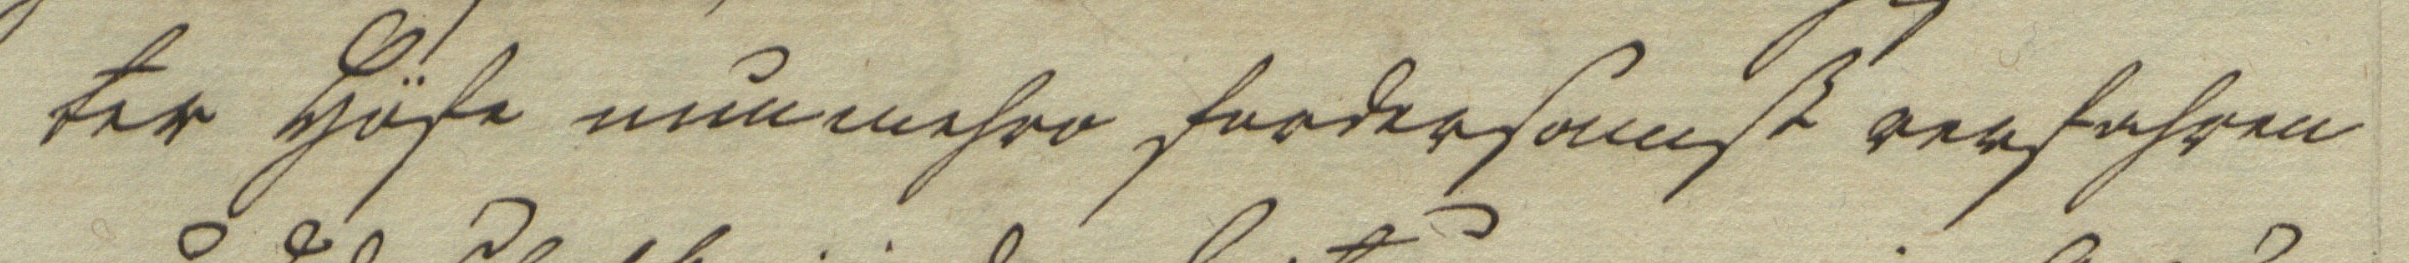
der Höfe nunmehro fordersamst verfahren
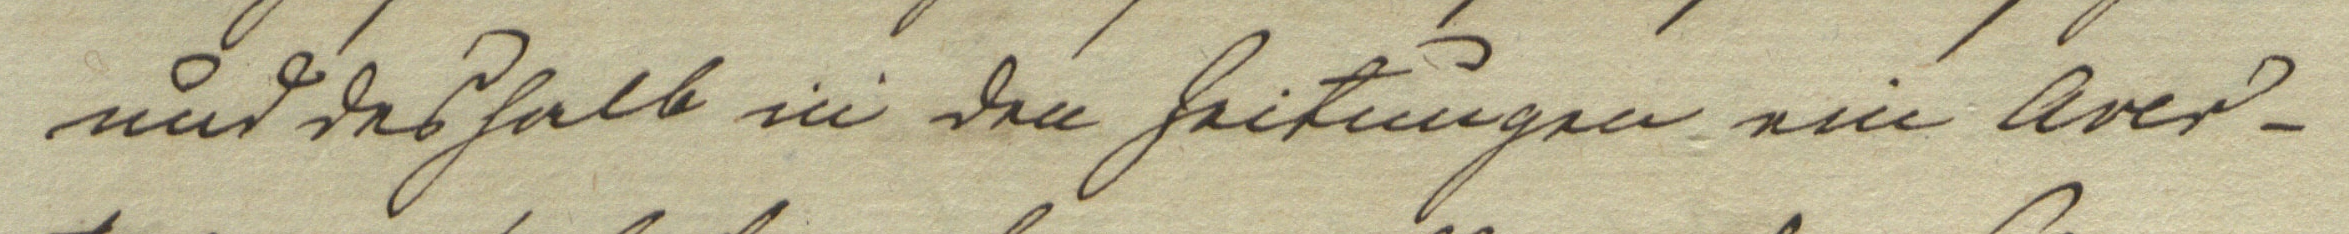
und deshalb in den Zeitungen ein Aver¬
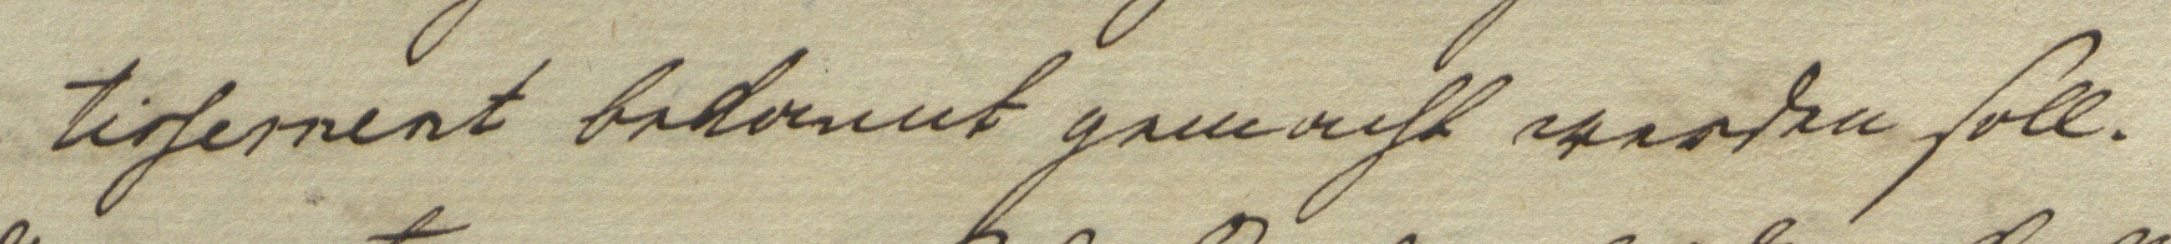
tissement bekannt gemacht werden soll.
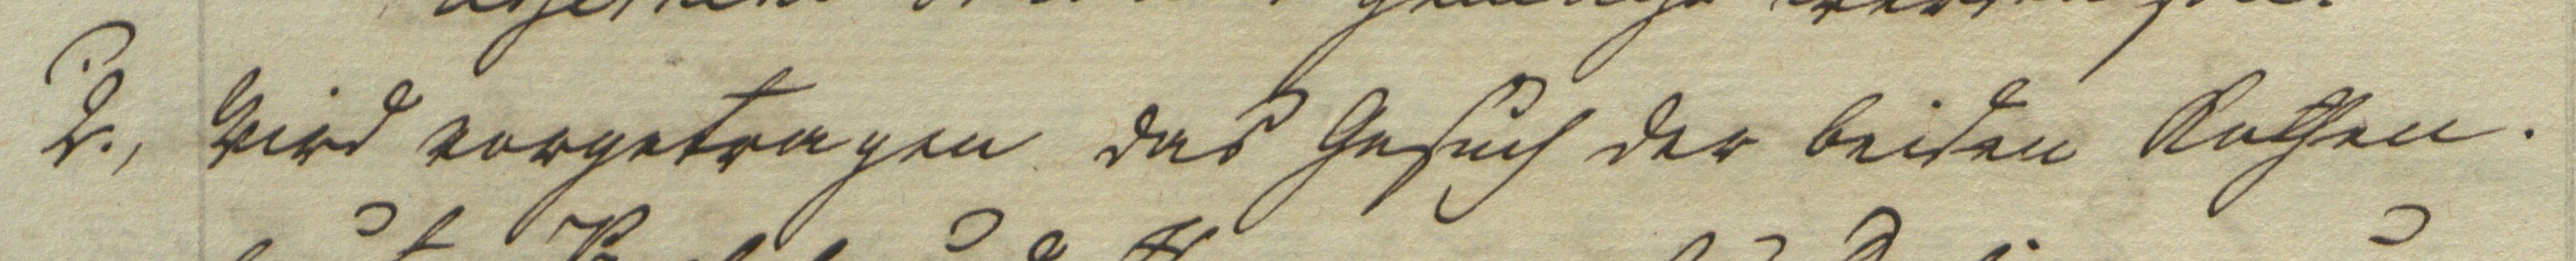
2., Wird vorgetragen das Gesuch der beiden Kathen¬
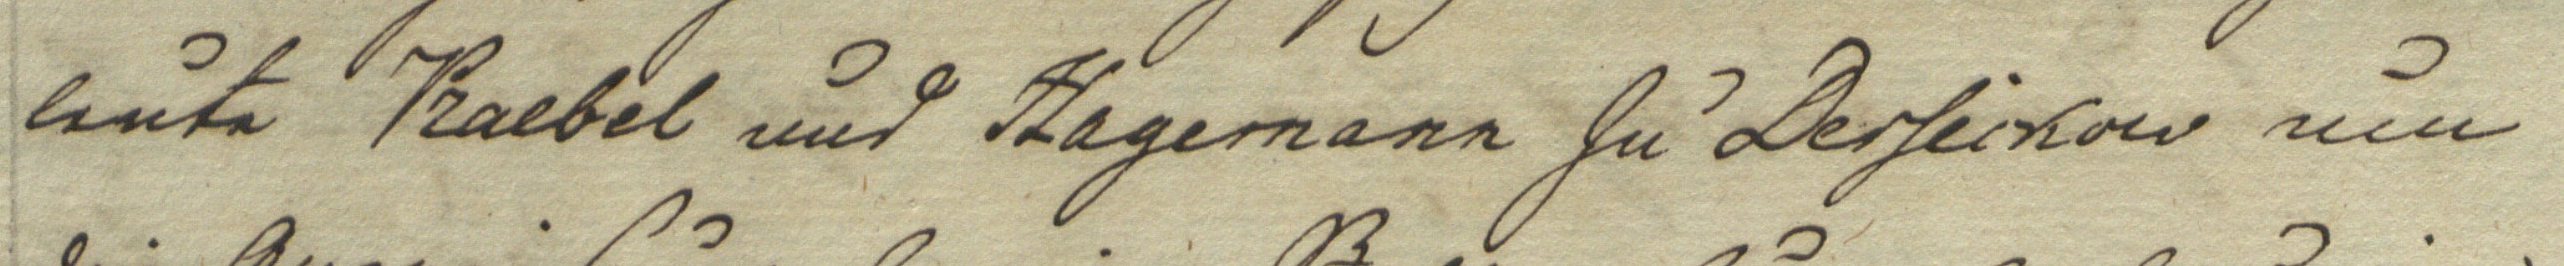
leute Praebel und Hagemann zu Derseckow um
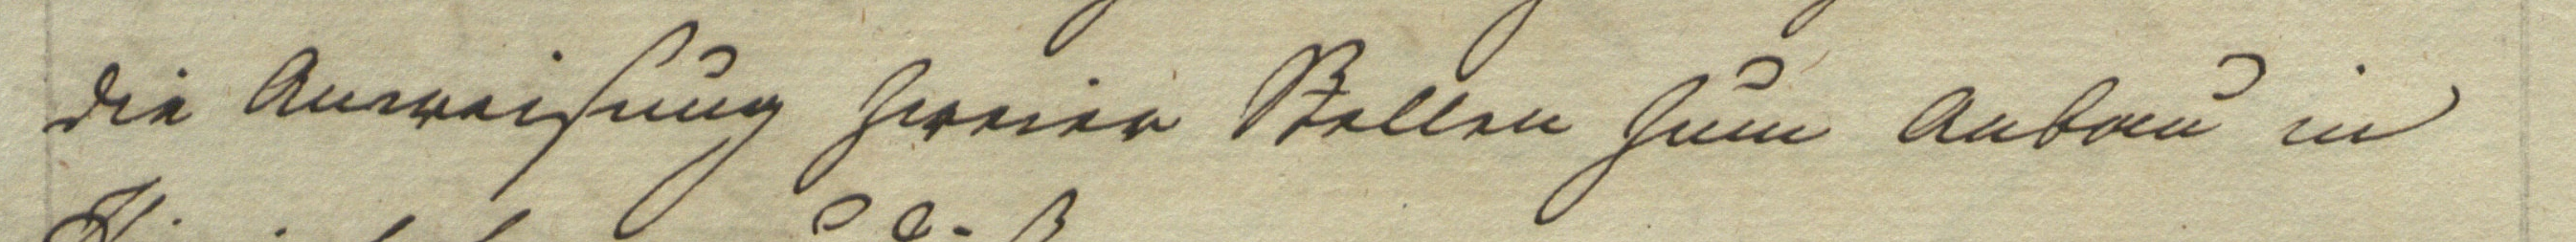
die Anweisung zweier Stellen zum Anbau in
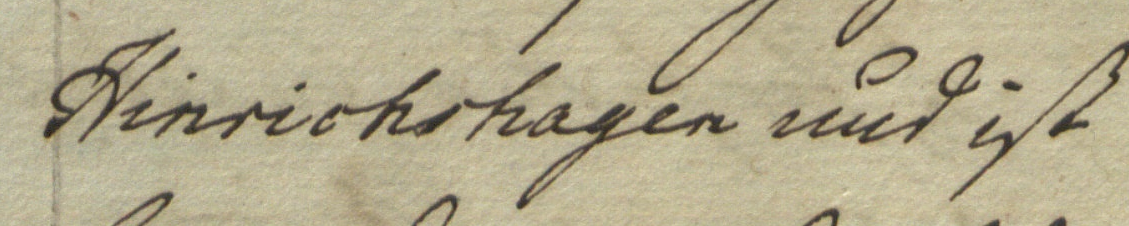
Hinrichshagen und ist
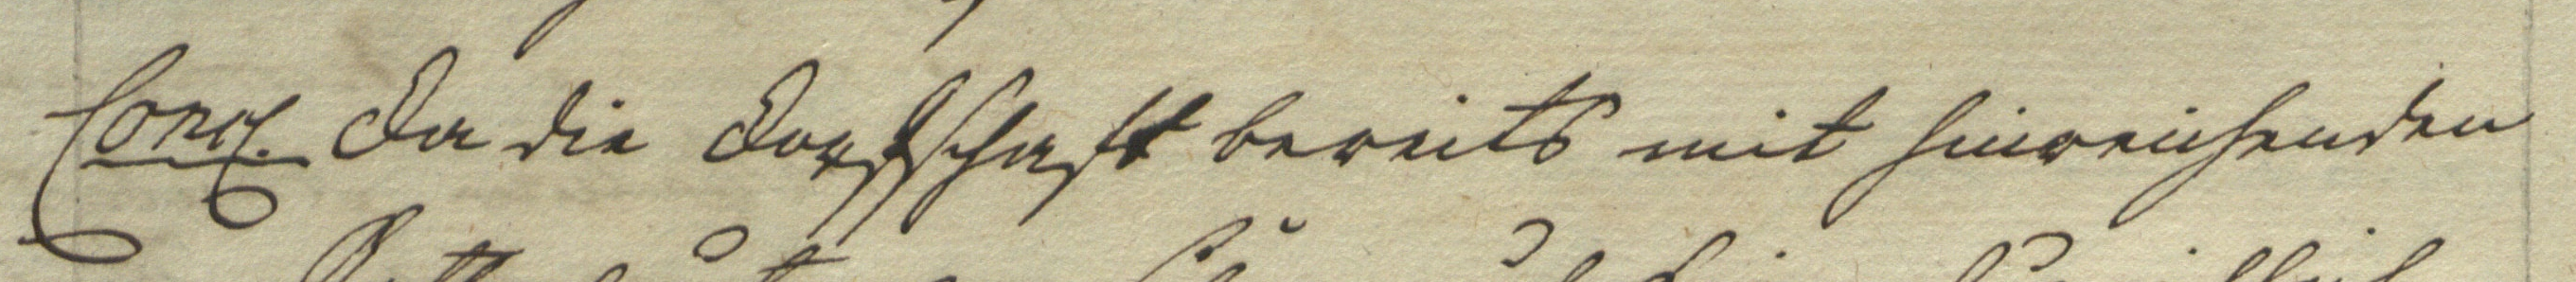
Concl. Da die Dorfschaft bereits mit hinreichenden
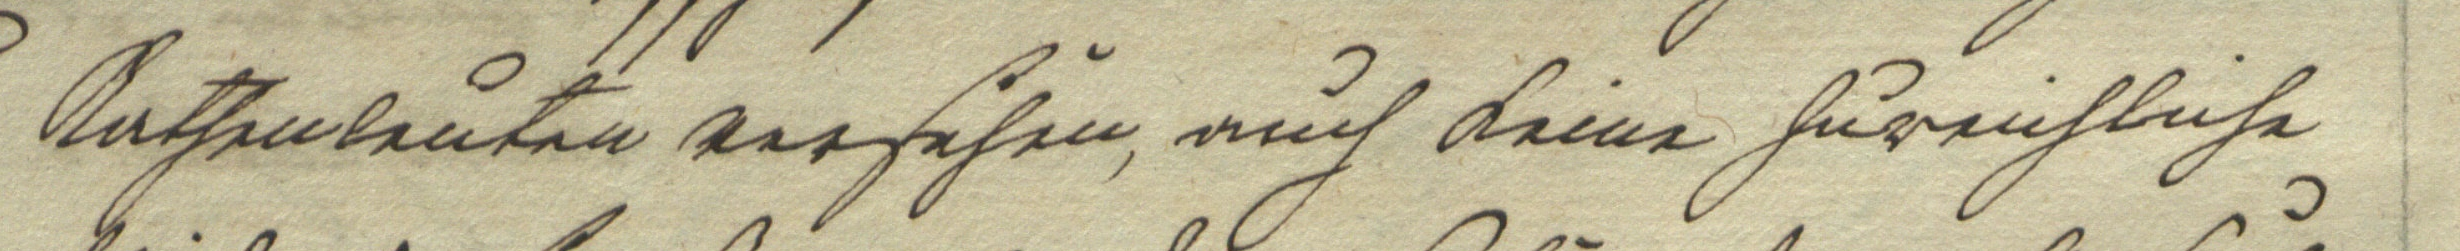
Kathenleuten versehen, auch keine zureichliche
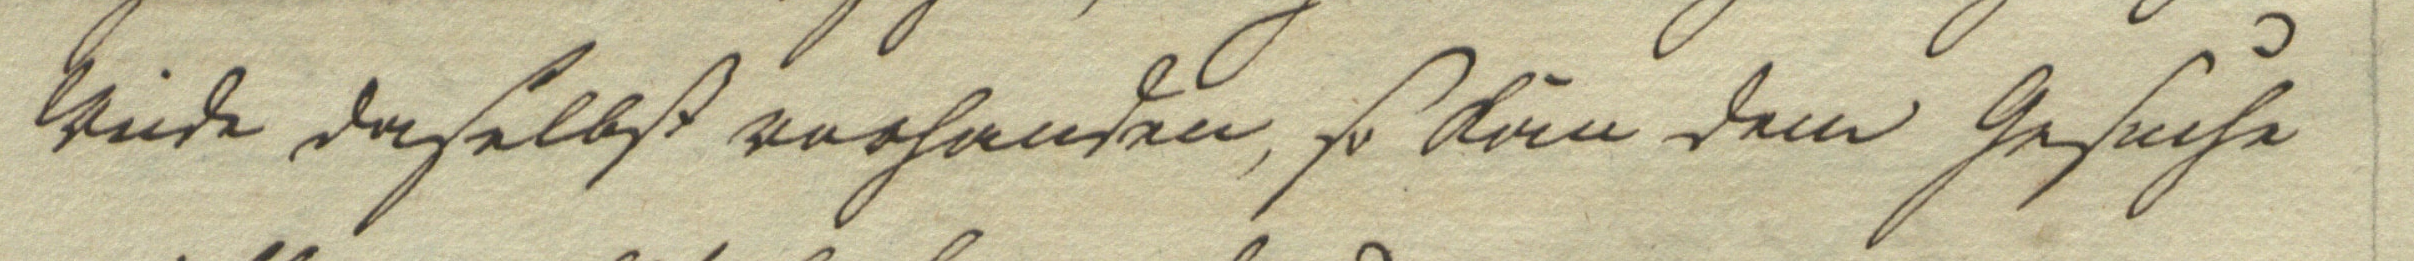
Weide daselbst vorhanden, so kan dem Gesuche
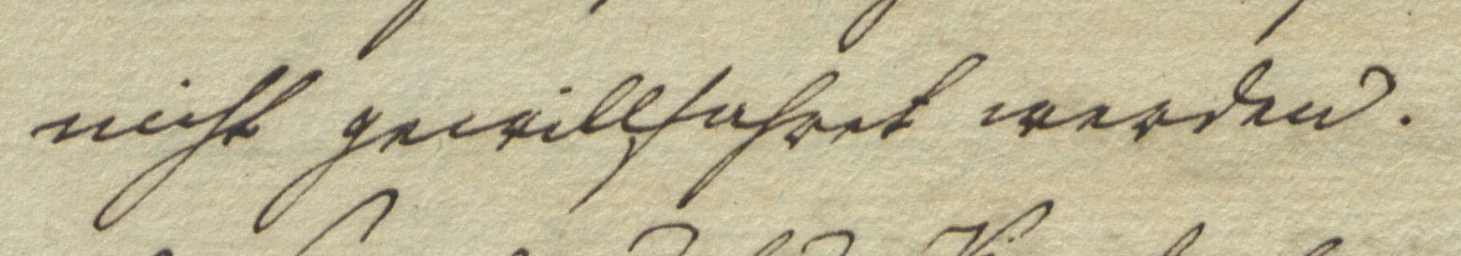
nicht gewillfahret werden.
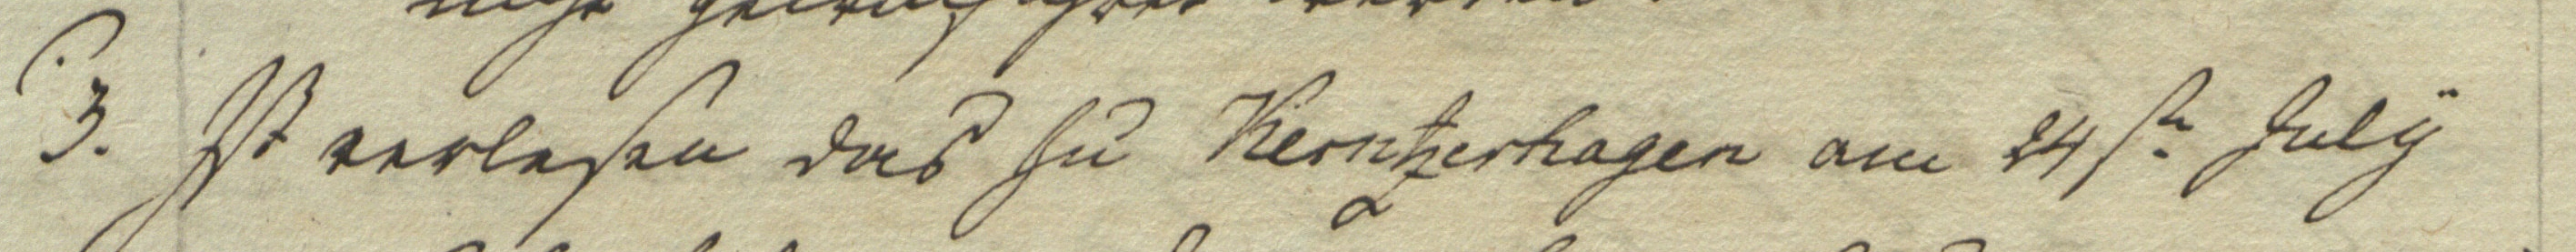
3. Ist verlesen das zu Kemtzerhagen am 24 t. Julÿ
